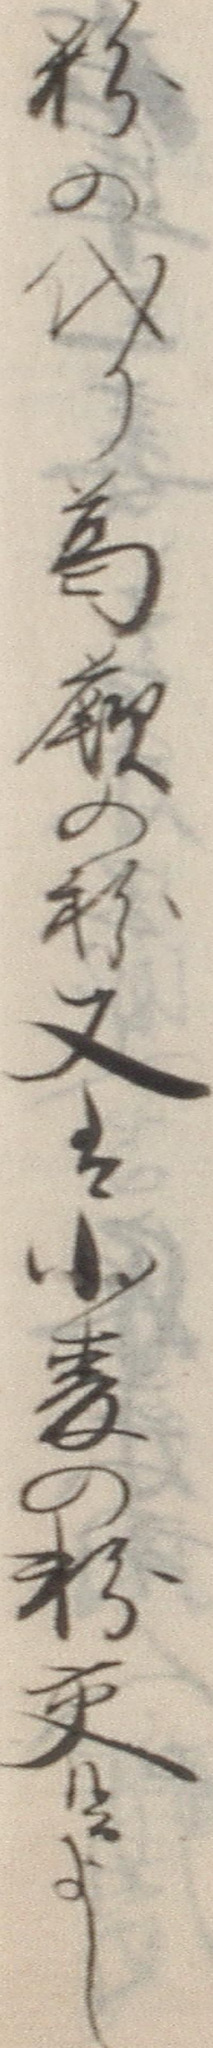粉の代り葛蕨の粉又は小麦の粉交候而よし
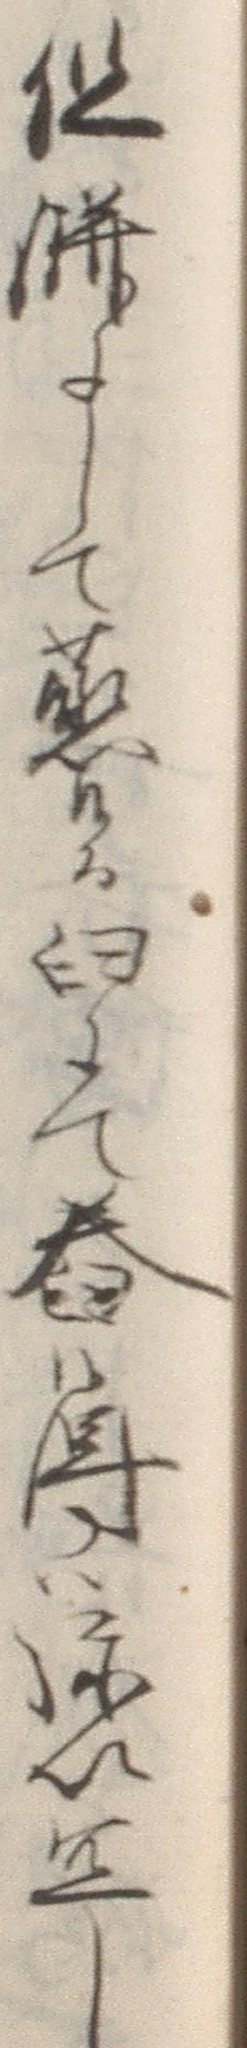但餅にして蒸候而臼ニ而舂候得ハ弥以宜し
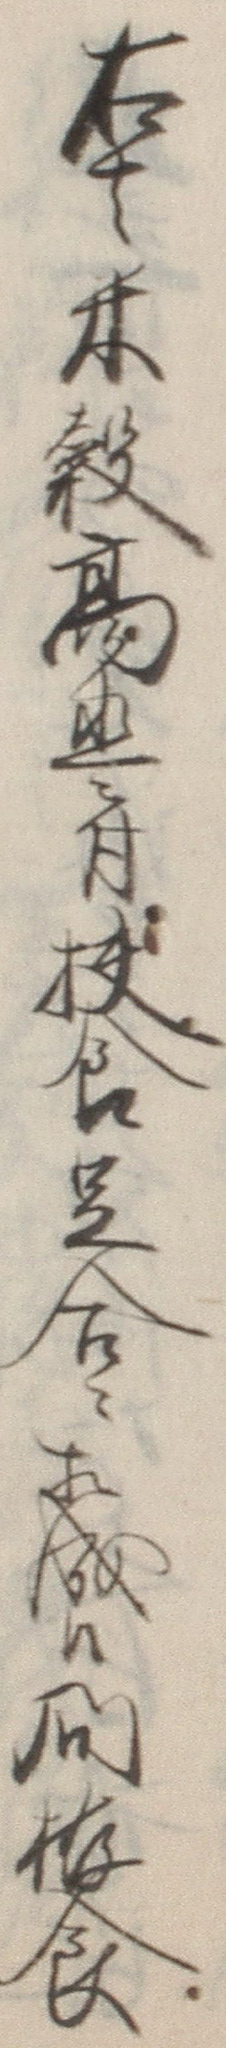右は米穀高直ニ付扶食足合ニ相成候間拵食
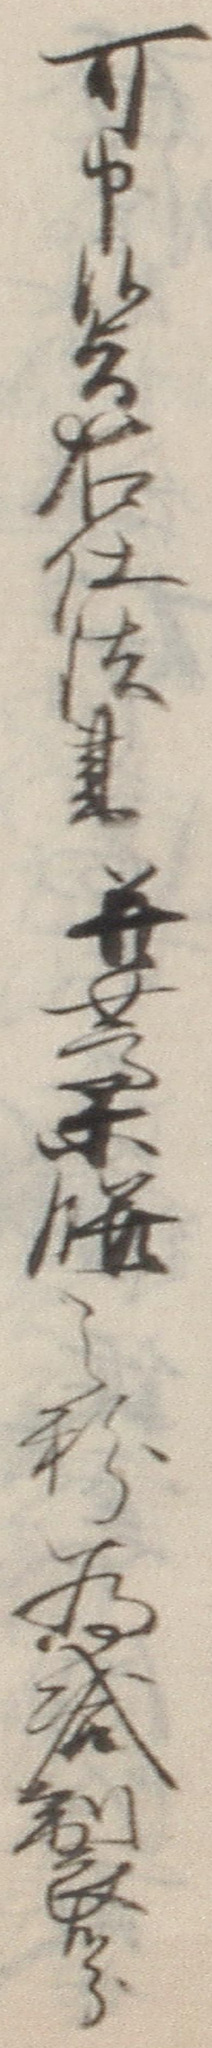可申候旨右仕法書并藁餅之粉為減製候分
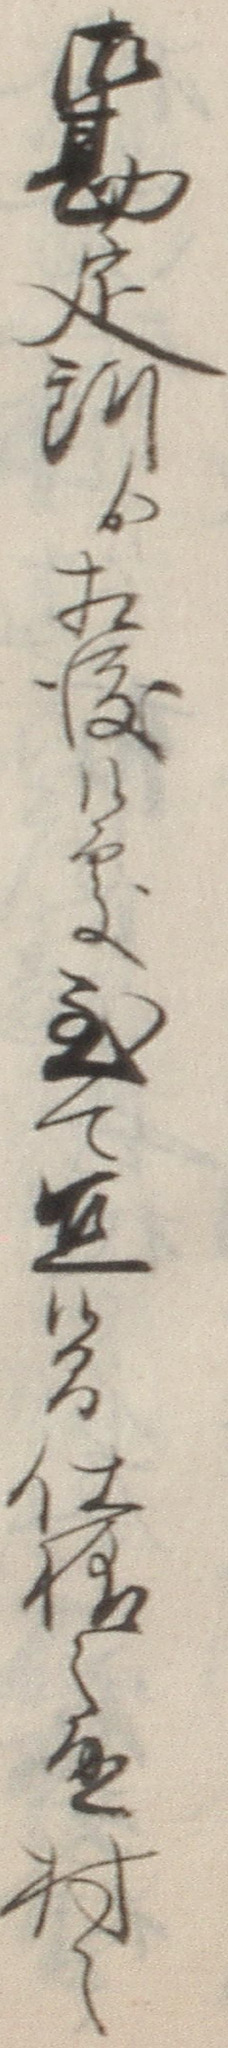御勘定所ゟ相渡候処至て宜候間仕様之通村々
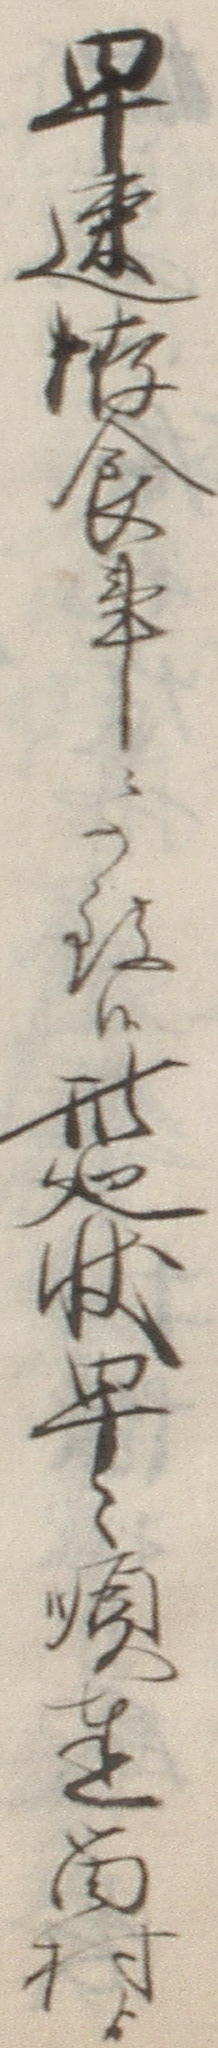早速拵食事ニ可致候此廻状早々順達留村ゟ
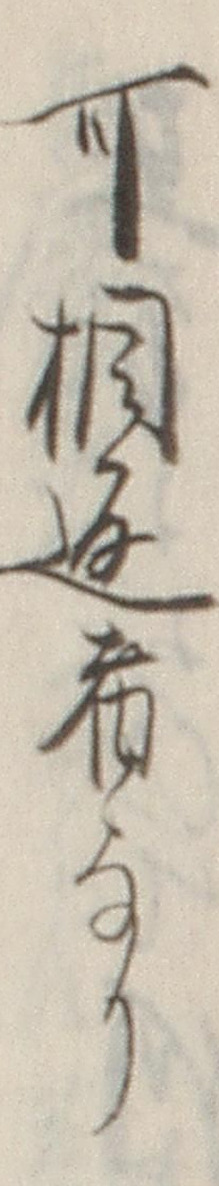可相返ものなり
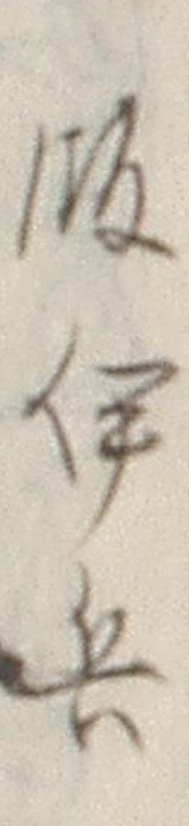飯伊兵
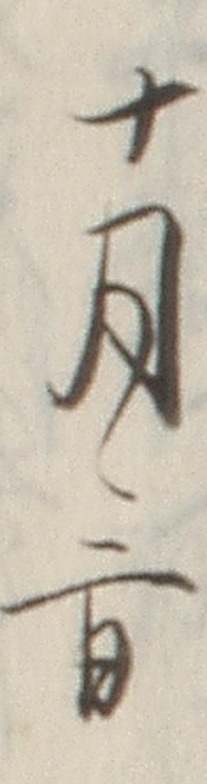十月三日
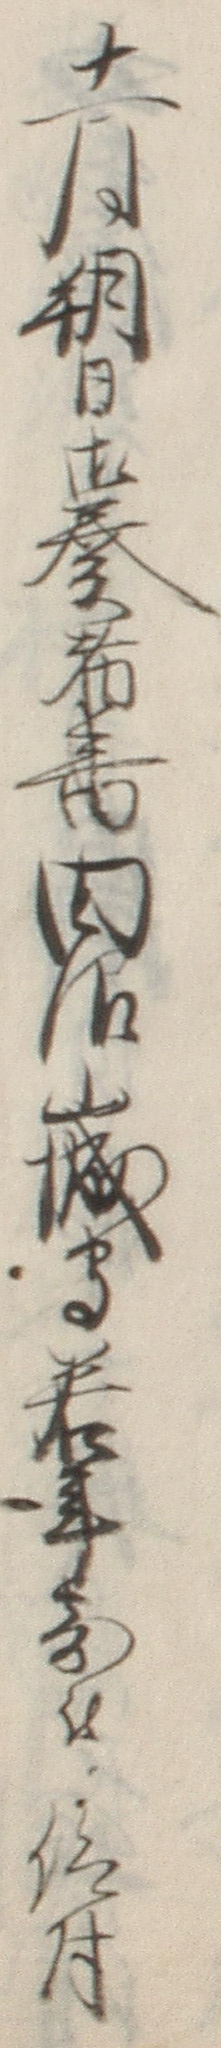十一月朔日御奏者番田沼山城守若年寄被仰付

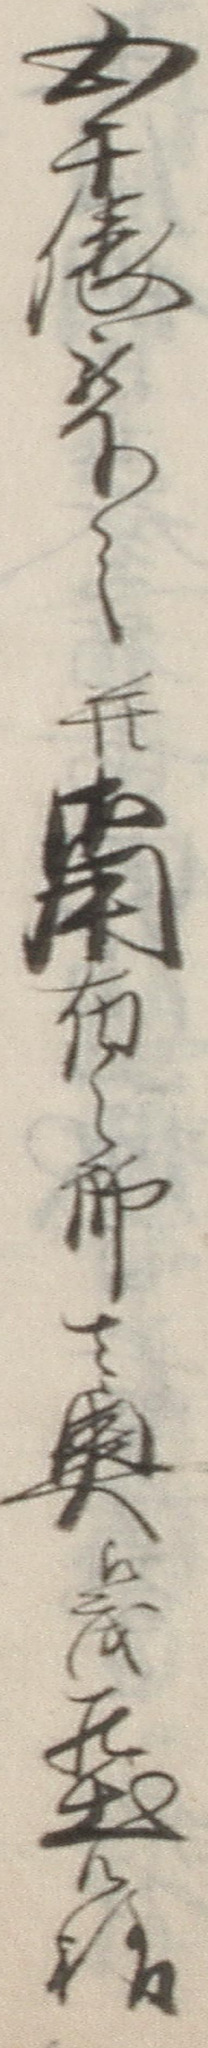五千俵被下候并御用有之節は奥えも罷出候様
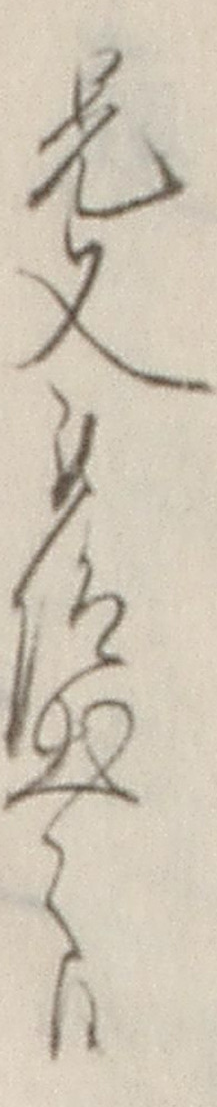是又被仰出候
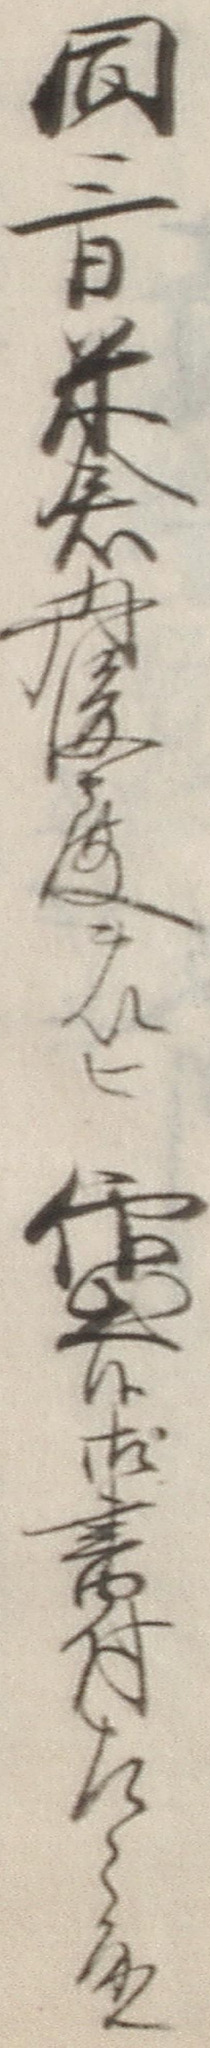同三日米倉丹後守殿ヲ以被仰出候御書付左之通
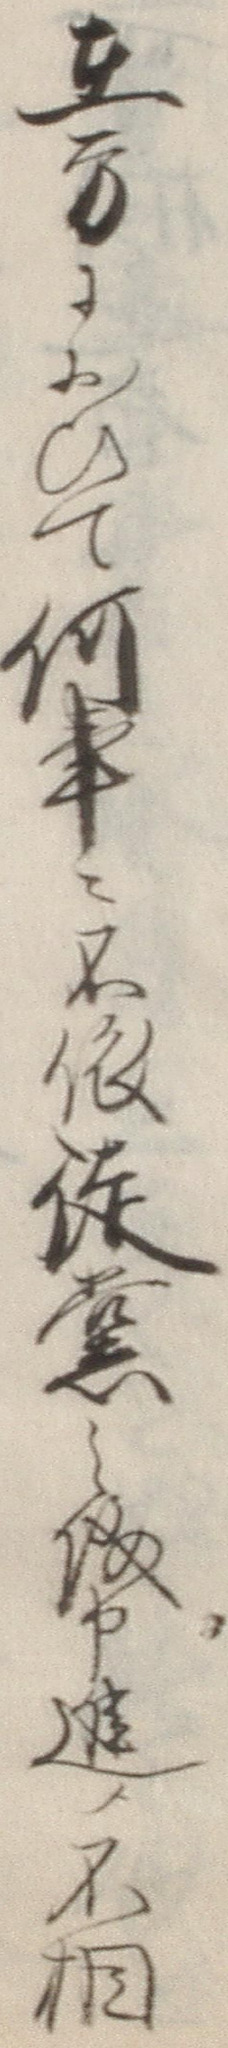在方におひて何事ニ不依徒党之儀申進メ不相
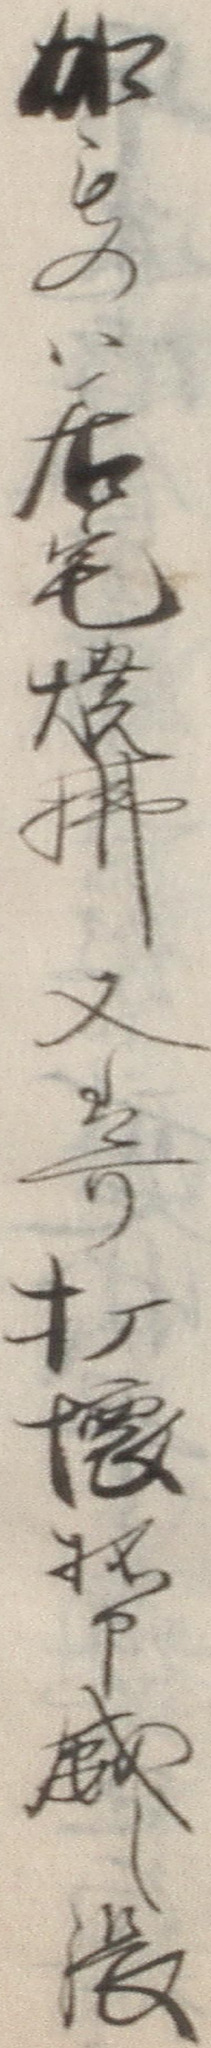那ものハ居宅焼払又は可打壊様申威候張
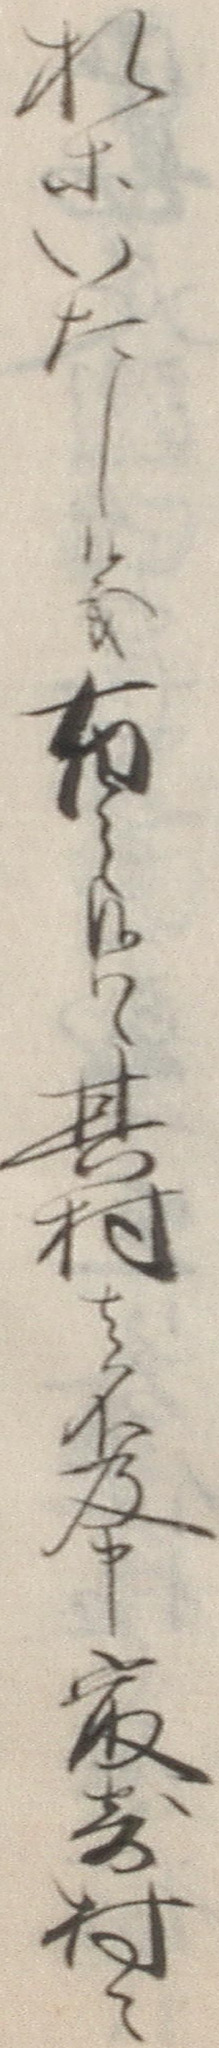札等いたし候も有之候ハゝ其村は不及申最寄村々
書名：[諸国災害記録]
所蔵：東京大学地震研究所図書室 Earthquake Research Institute Library, The University of Tokyo, JAPAN
